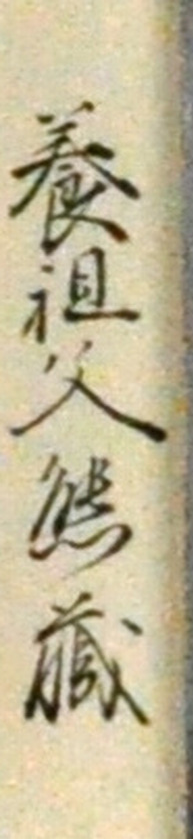養祖父熊蔵
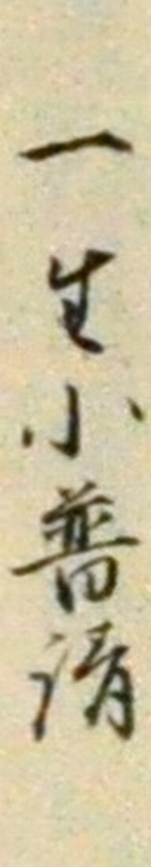一生小普請
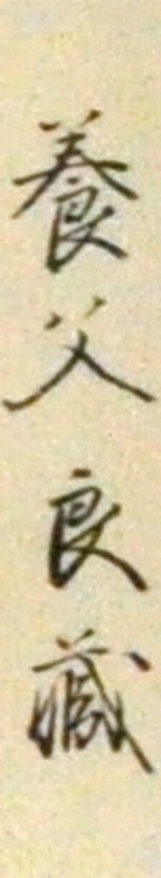養父良蔵
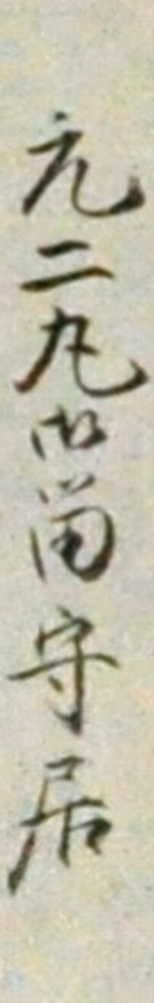元二丸御留守居
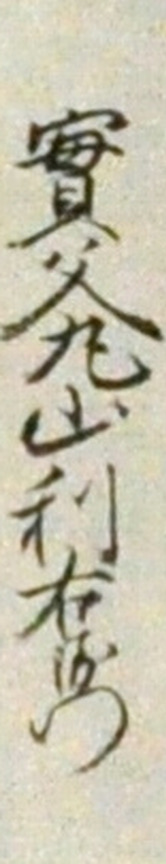實父丸山利右衛門
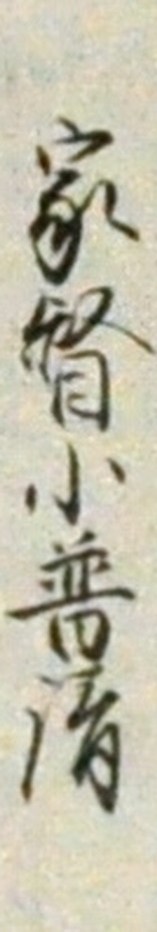家督小普請
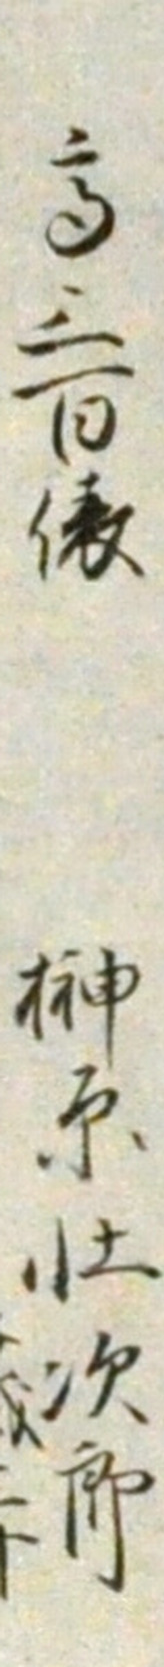高三百俵榊原壮次郎
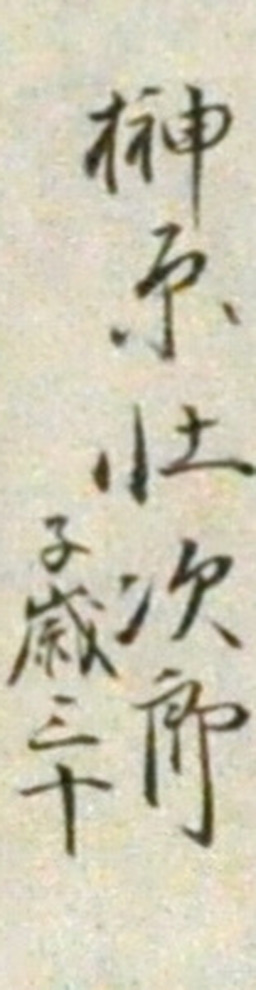子歳三十
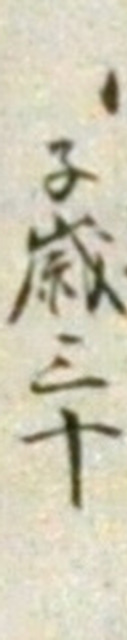子歳三十
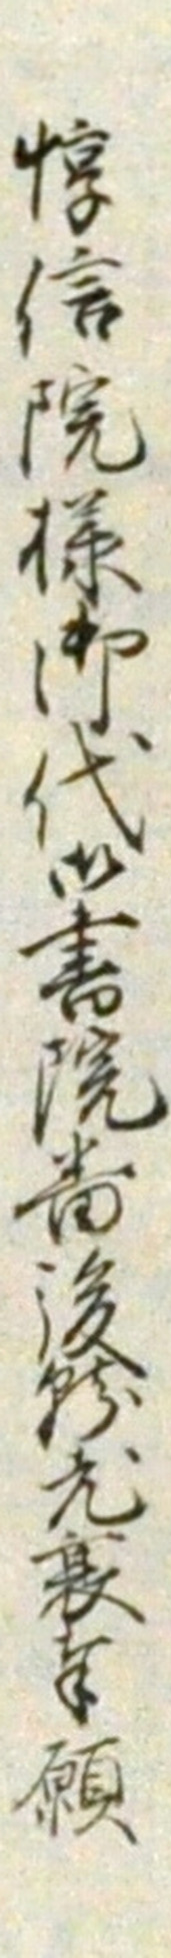惇信院様御代御書院番後就老衰奉願
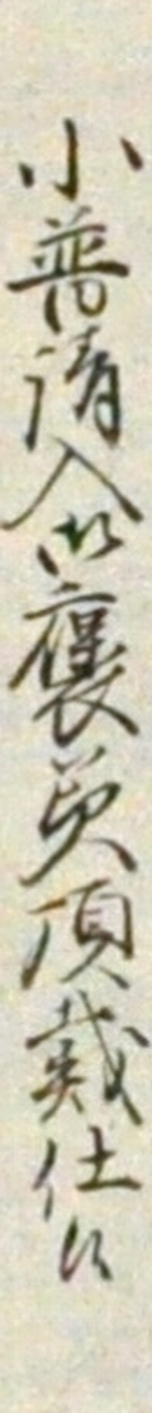小普請入御褒美頂戴仕候
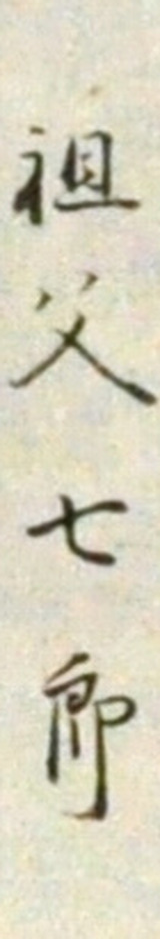祖父七郎
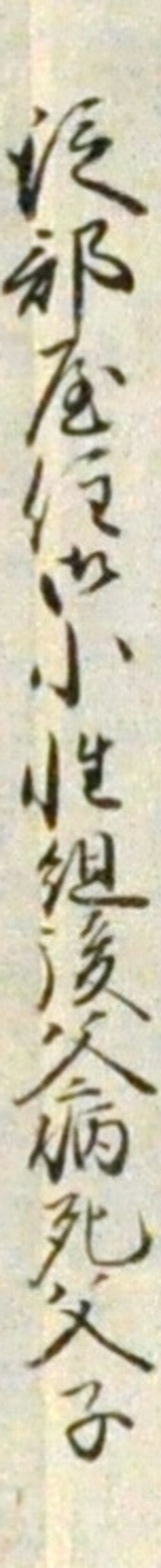従部屋住御小姓組後父病死父子
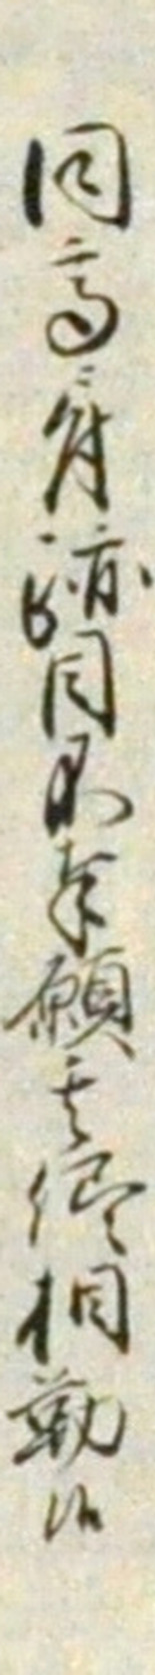同高ニ付跡目不奉願其侭相勤候
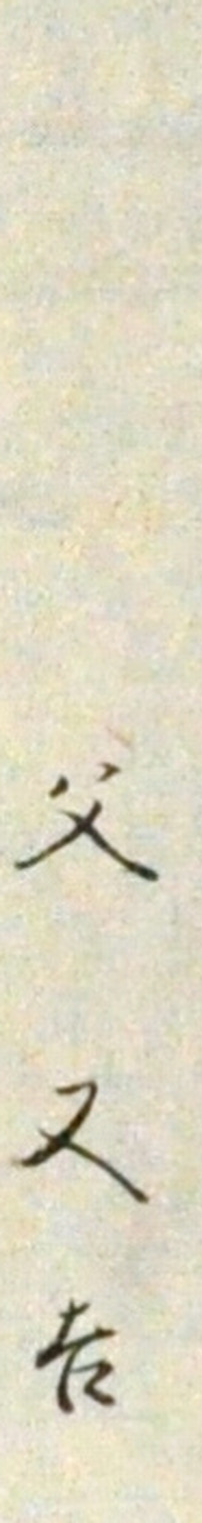父又吉
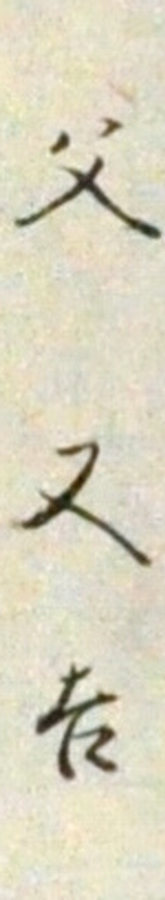父又吉
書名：若年寄御役中御調書付
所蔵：伊那市立高遠町図書館・合同会社AMANE
